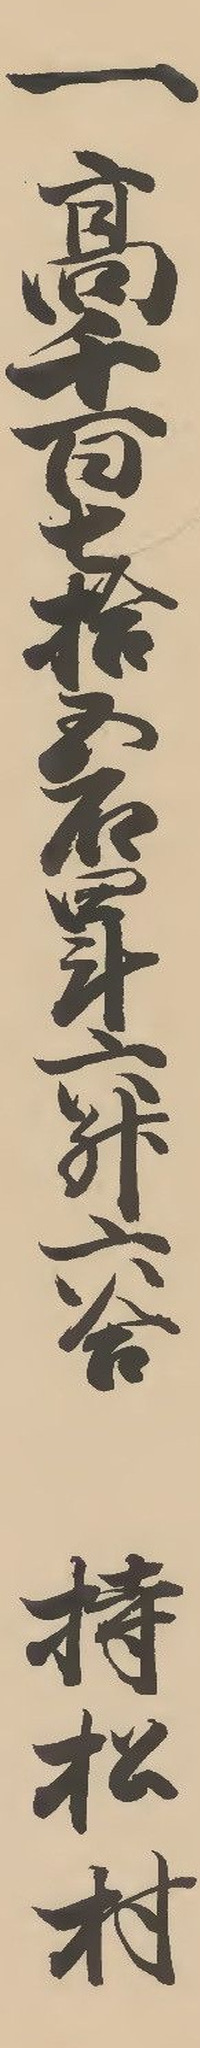一髙千百七拾五石四斗六升六合持松村
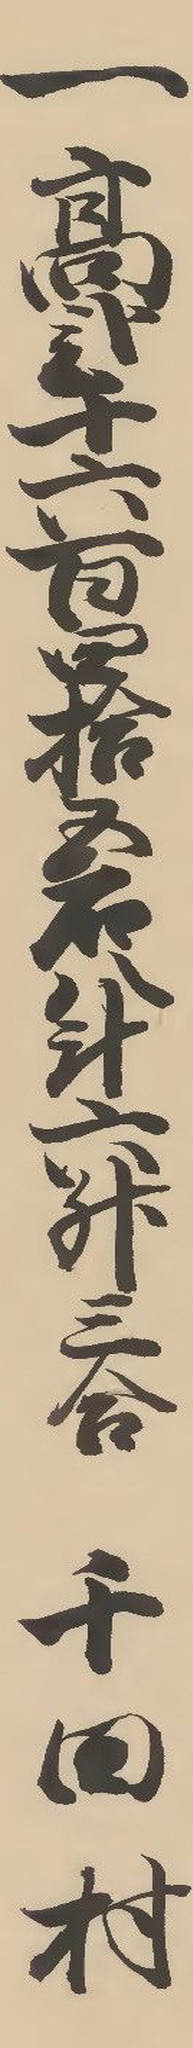一髙弐千六百四拾五石八斗六升三合千田村
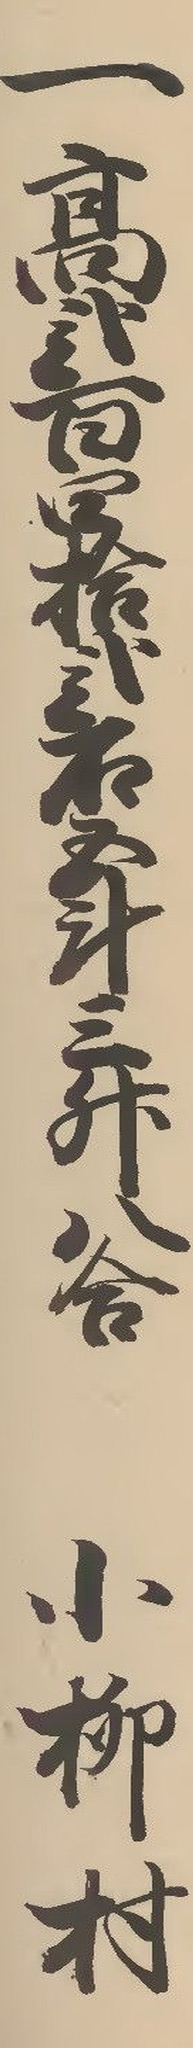一髙弐百四拾弐石五斗三升八合小柳村
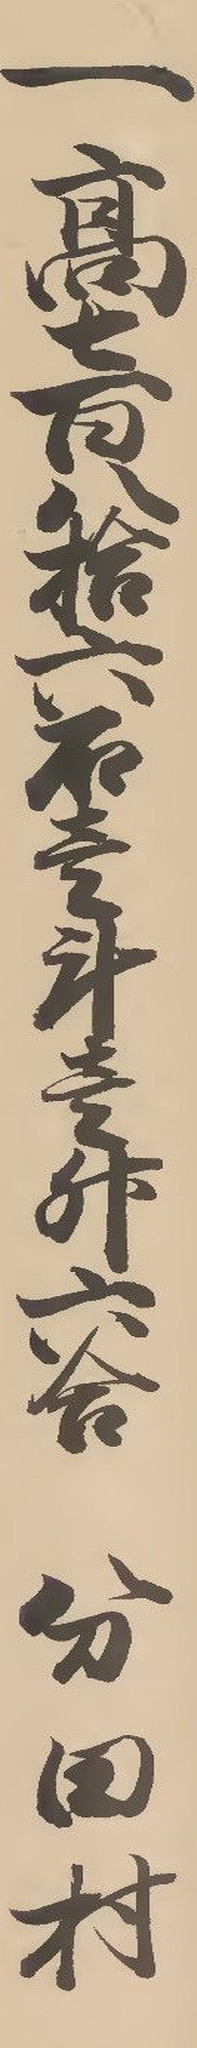一髙七百八拾六石壱斗壱升六合分田村
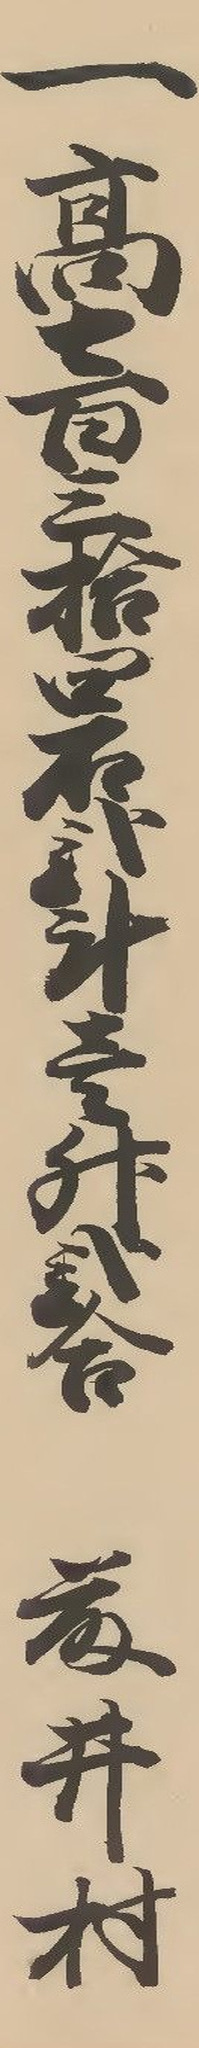一髙七百三拾四石弐斗壱升弐合藤井村
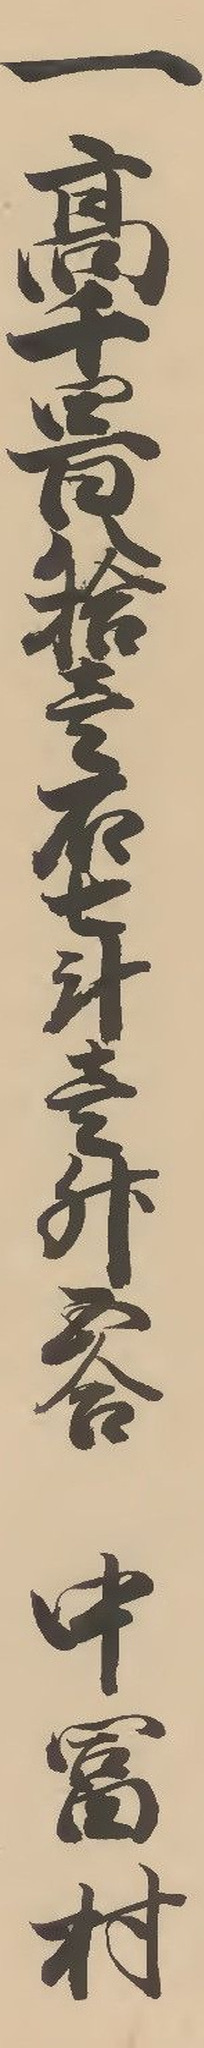一髙千四百八拾壱石七斗壱升五合中冨村
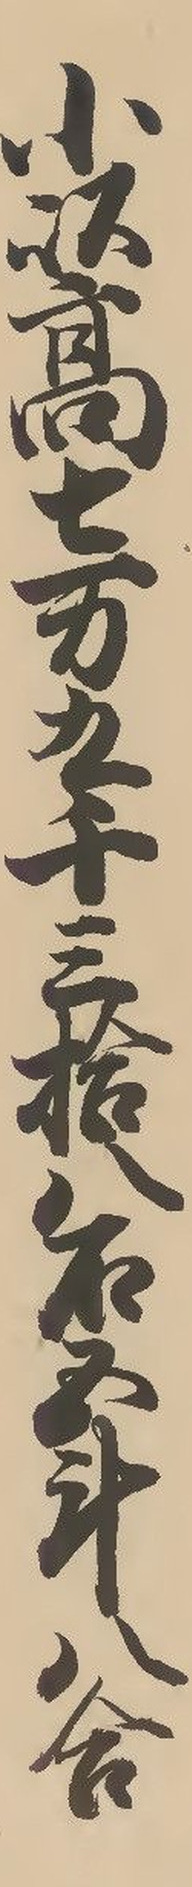小以髙七万九千三拾八石五斗八合

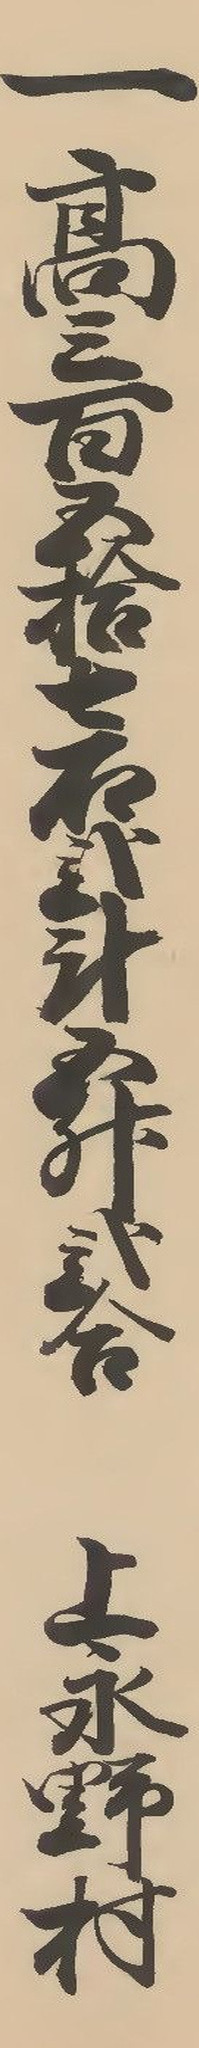一髙三百五拾七石弐斗五升弐合上永野村
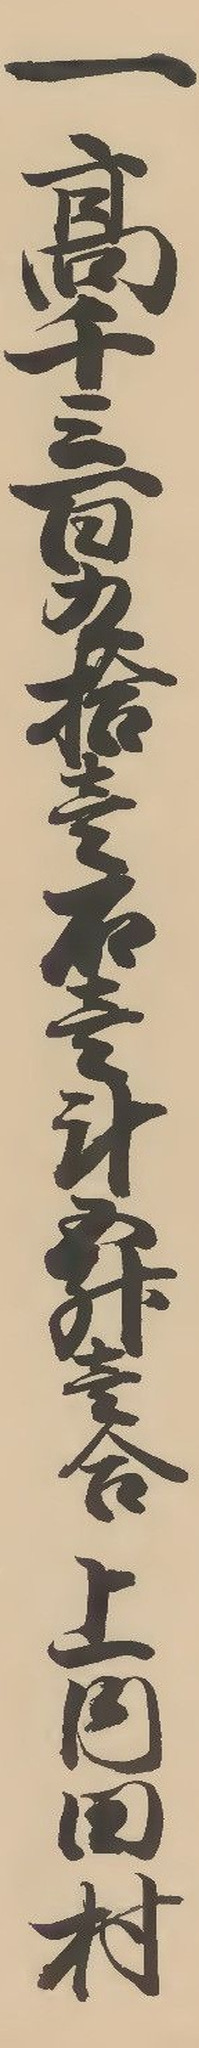一髙千三百九拾壱石壱斗五升七合上内田村
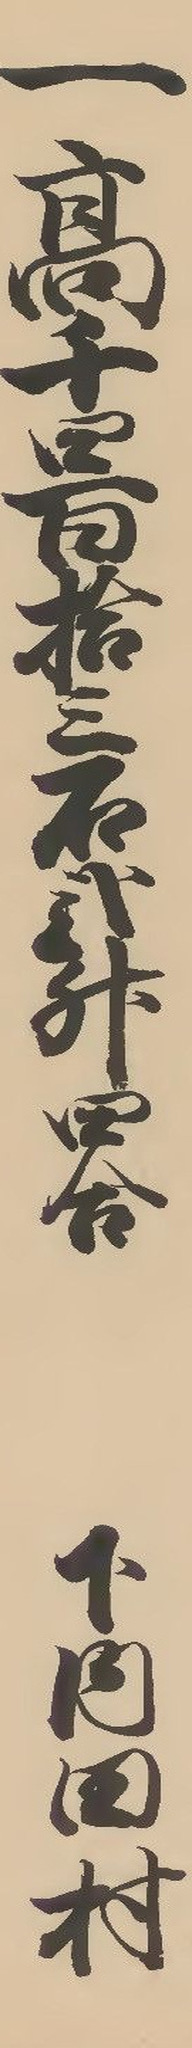一髙千四百拾三石弐升四合下内田村

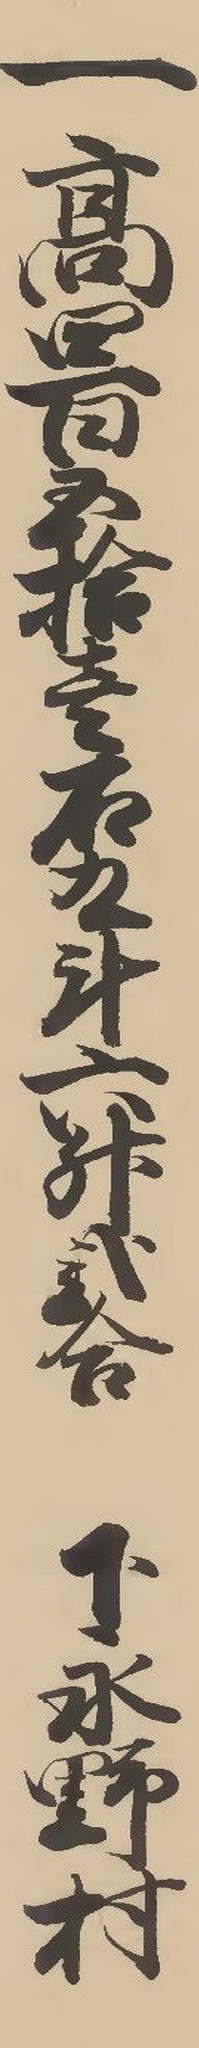一髙四百五拾壱石九斗六升弐合下永野村
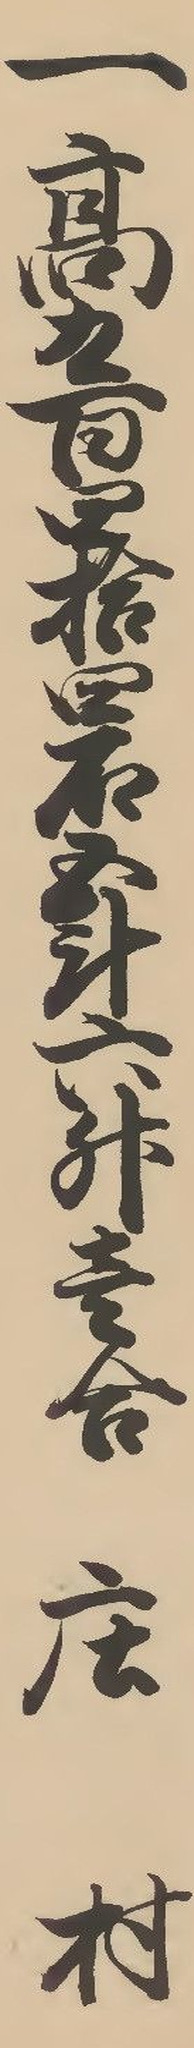一髙九百四拾四石五斗六升壱合庄村
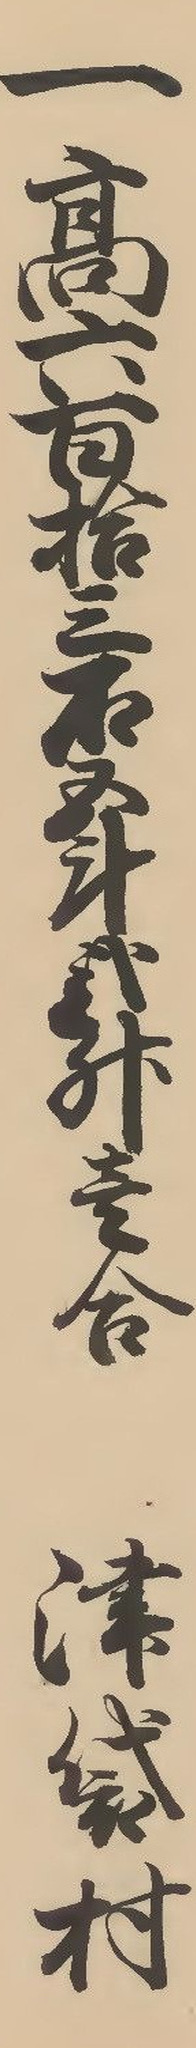一髙六百拾三石五斗弐升壱合津袋村
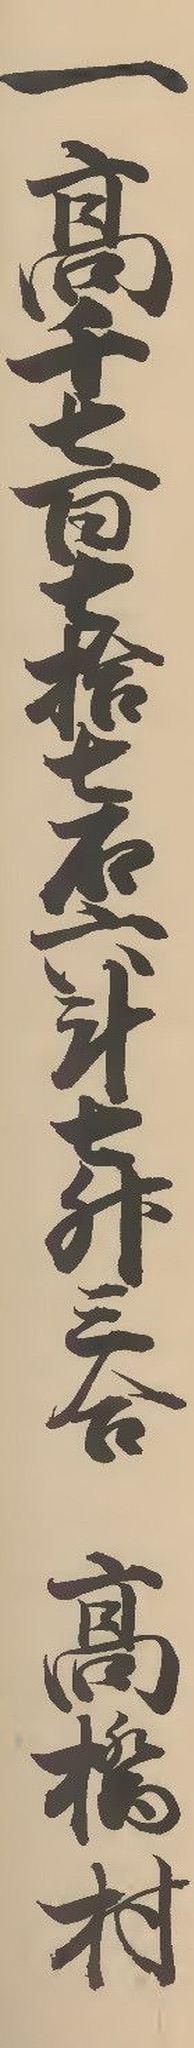一髙千七百七拾七石六斗七升三合高橋村
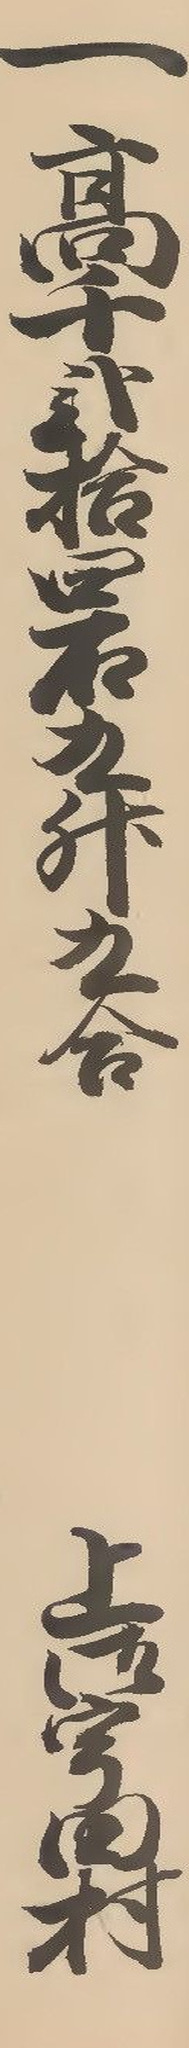一髙千弐拾四石九升九合上御宇田村
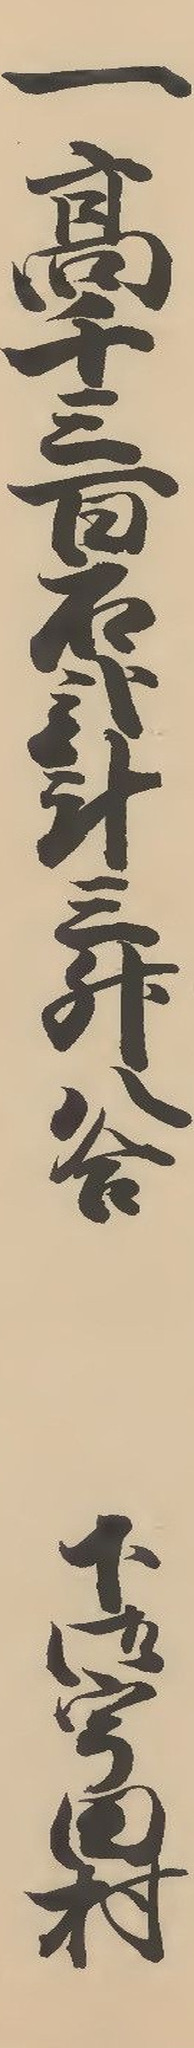一髙千三百石弐斗三升八合下御宇田村
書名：肥後国郷帳
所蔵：国立公文書館 National Archives of Japan
